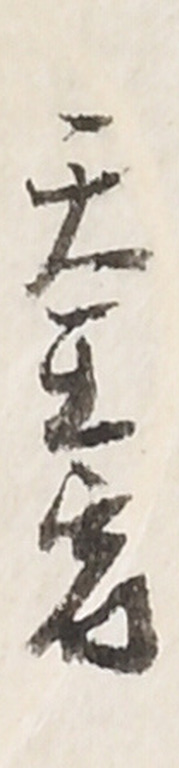天王宿
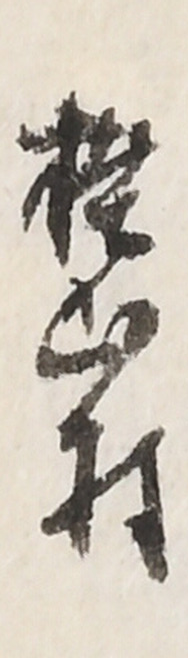樫山村
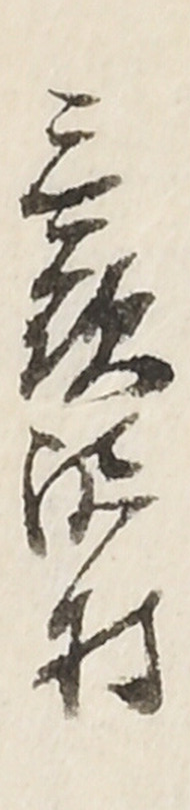三夜沢村

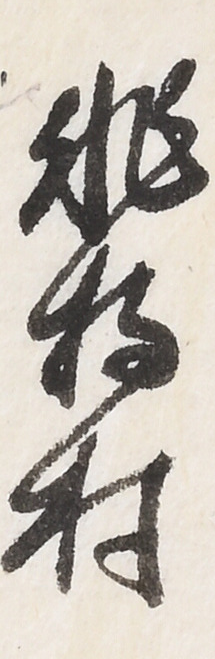非持村
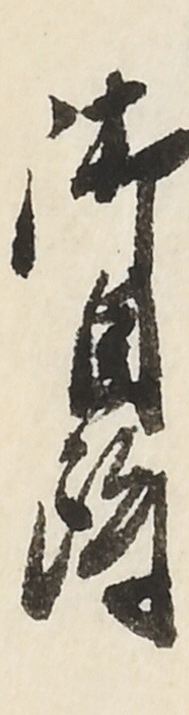御目附
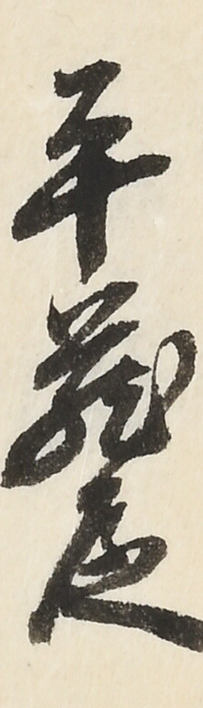平蔵殿
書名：安政六己未年二月石切旅稼名前書上帳
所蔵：伊那市立高遠町図書館・合同会社AMANE
